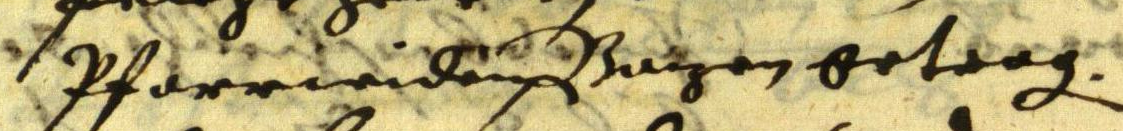Pfarrwidem Bozen getrag
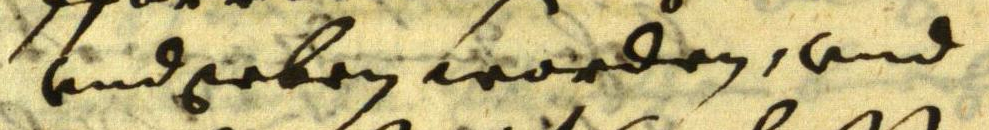vnd geben worden, vnd
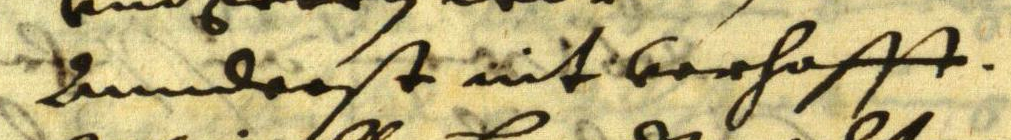Annderst nit verhofft.
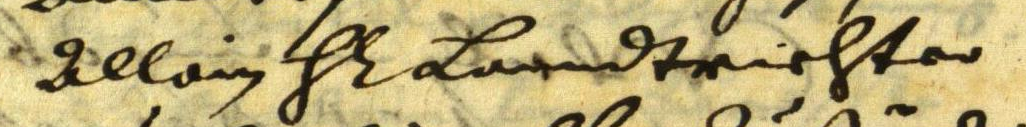Allain h Landtrichter
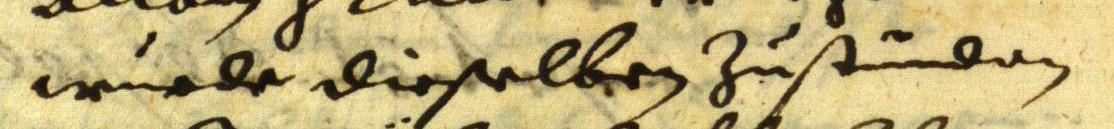wūrde dieselben Zūstūndan
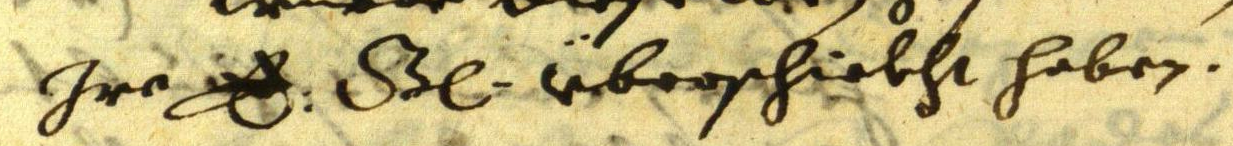Ire xxx G: v̈berschickht haben.
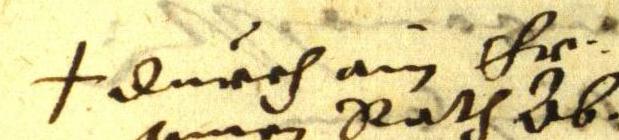dūrch ain Er¬
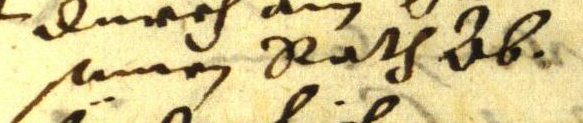samen Rath Ab¬
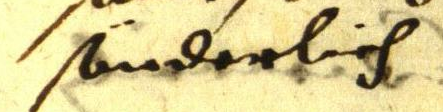sonderlich
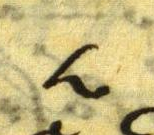t
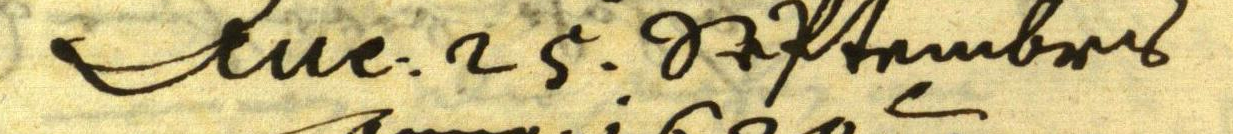Am: 25. SePtembris
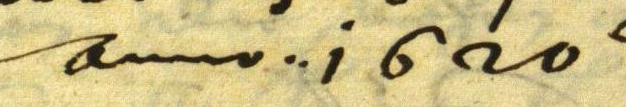Anno: 1620.t
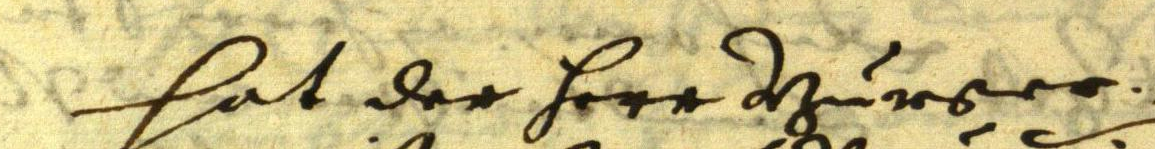Hat der herr Būrger¬
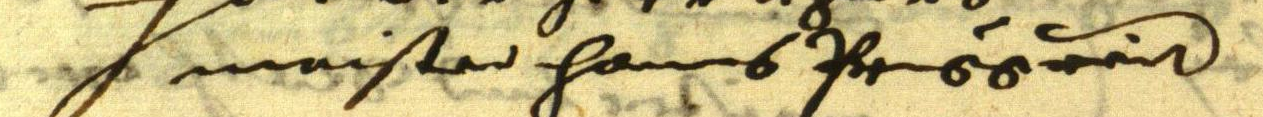maister Hanns Prūggreit
